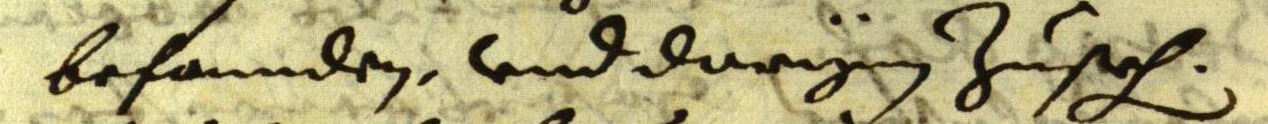befannden. vnd darÿnn Zūseh
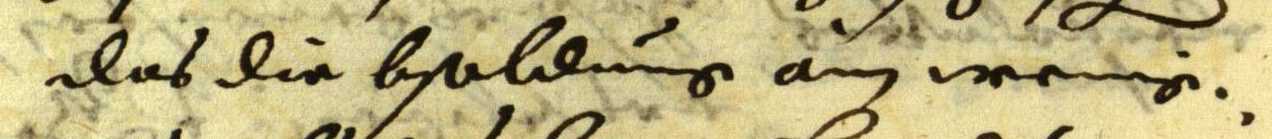das die bsoldūng ain wenig¬
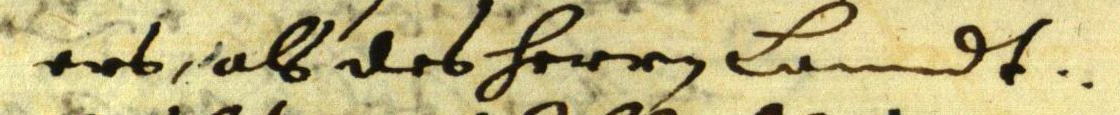ers, als des herrn Lanndt¬
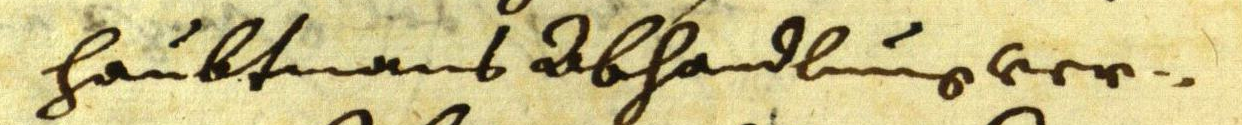haūbtmans Abhandlūng ver¬
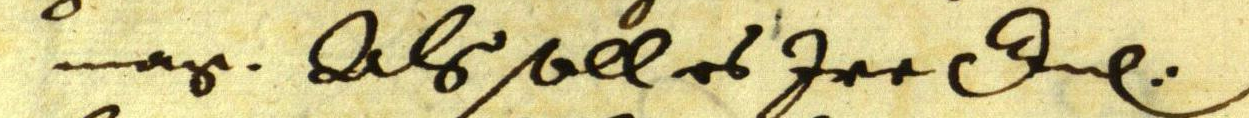mag. Als soll es Ire Gn:
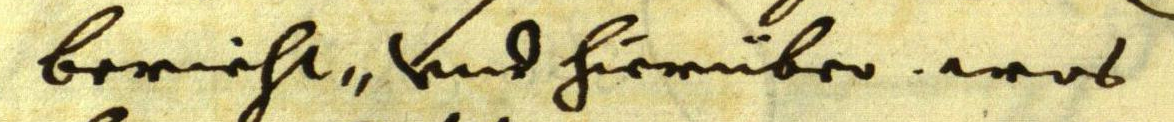bericht,, vnd hierüber. was
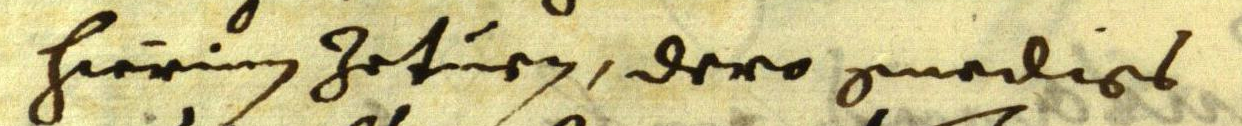hierinn Zetūen, dero gnedigs
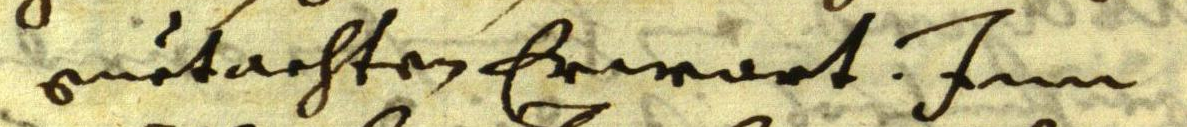gūetachten Erwart. Inn
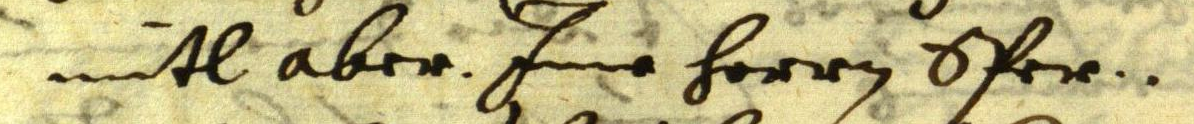mitl aber. Ime herrn Sper¬
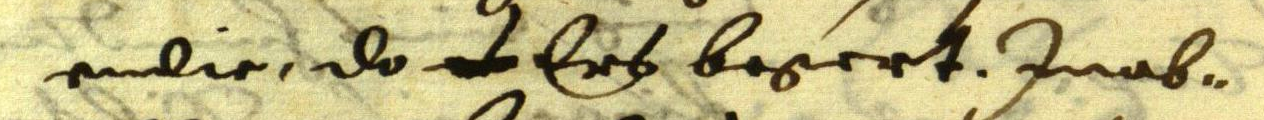endie, da Ers begert. Inab¬
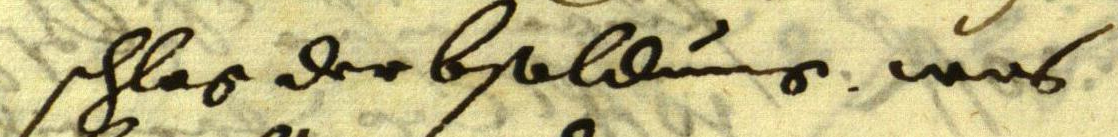schlag der bsoldūng. was
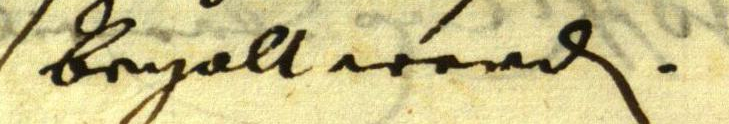bezalt werd.
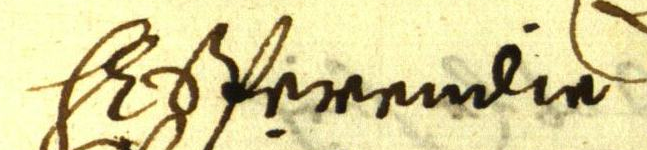H Sperendie
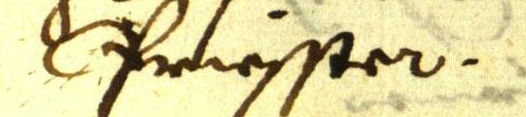Priesster.
